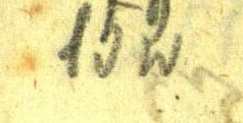152
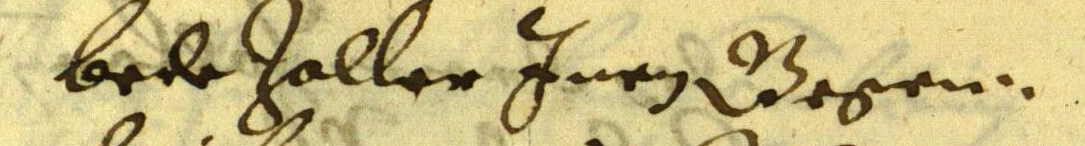bede Zoller Inen Gegen¬
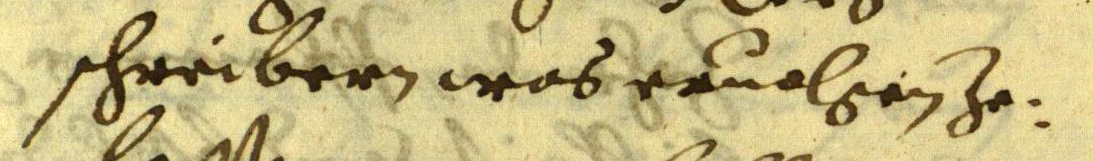schreibern was erūolgen Ze¬
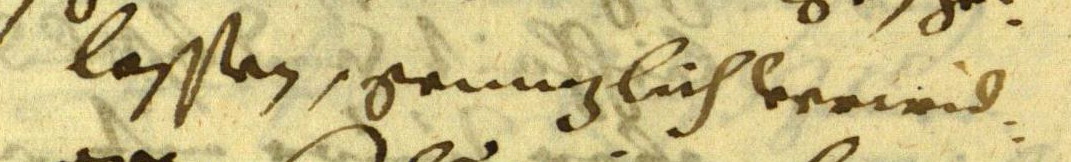lassen, gennzlich verwid¬
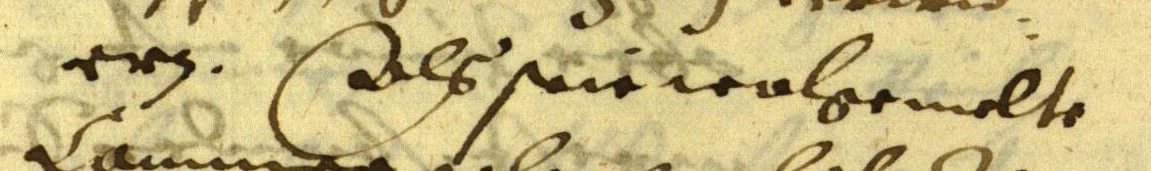ern. Als sie wolgemelte
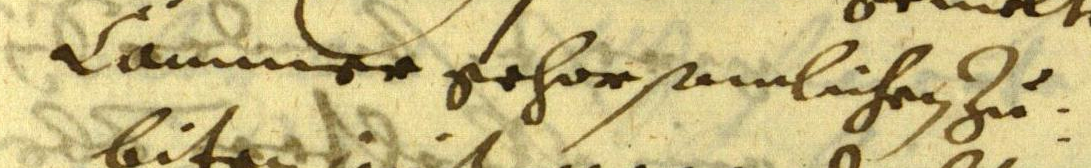Cammer gehorsamlichen Zū¬
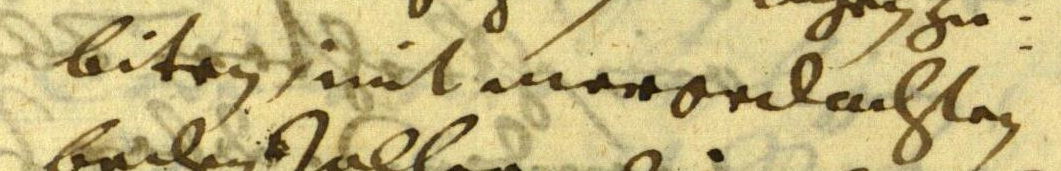biten mit mergedachten
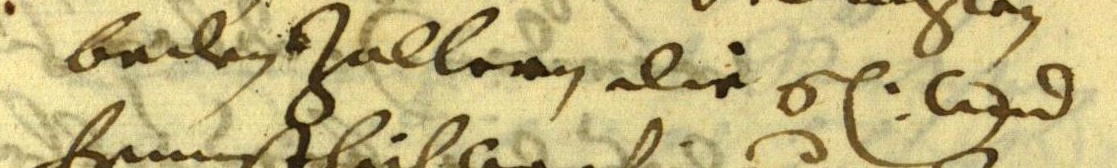beden Zollern die g: vnd
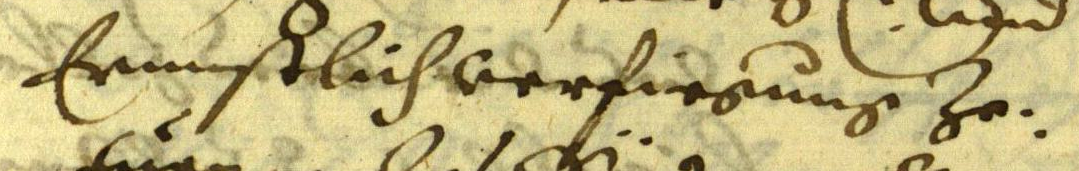Ernnstlich verfiegūng Ze¬
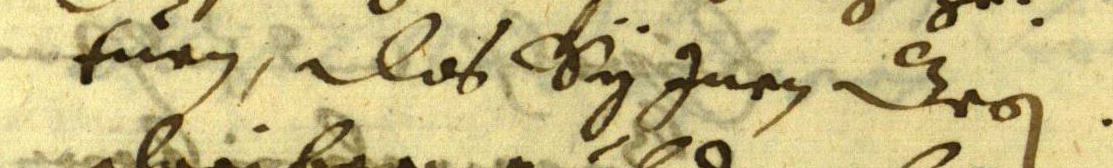tūen, das Sÿ Inen Geg¬
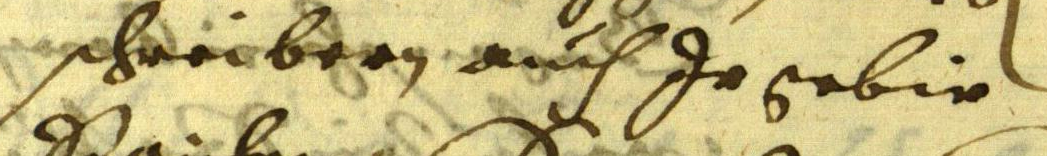schreibern aūch Ir gebir
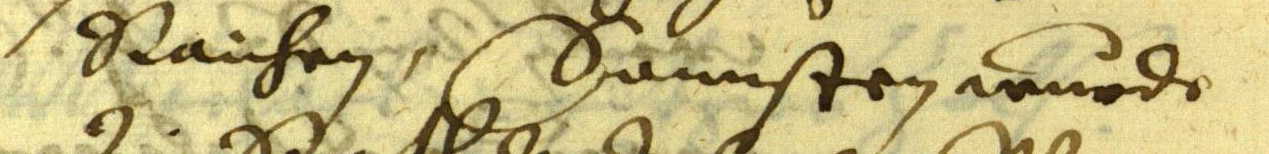Raichen, Sonnsten wūrde
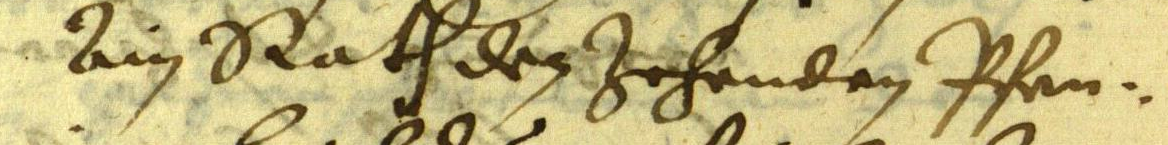Ain Rath den Zehenden Pfen¬
